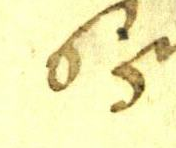65
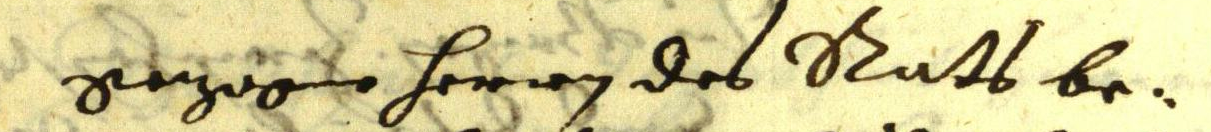gezogne herrn des Rats be¬
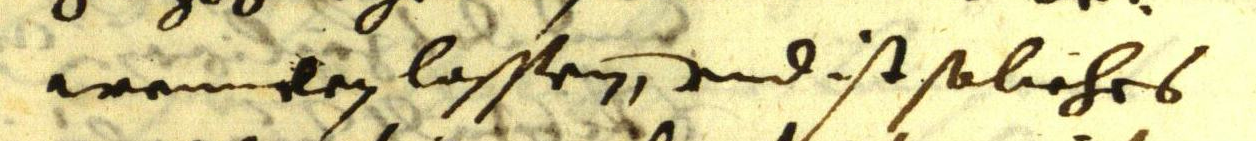wennden lassen vnd ist soliches
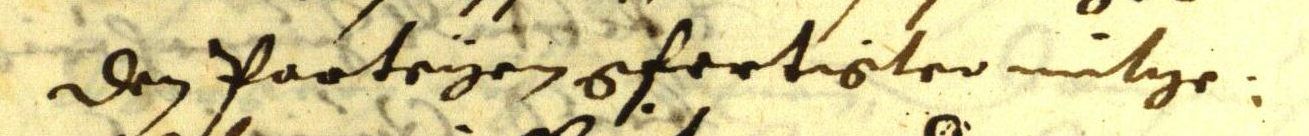den Parteÿen gfertigter mitze¬
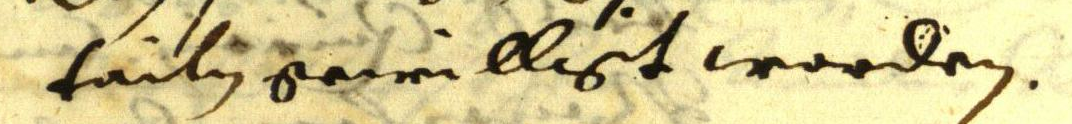tailn gewilligt worden.
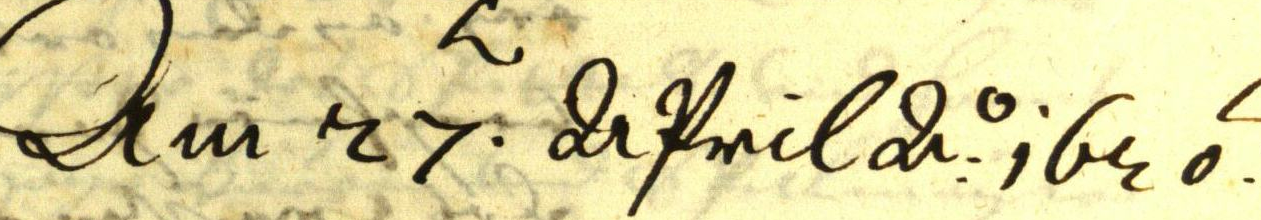Am 27t. APril Ao: 1620 t.
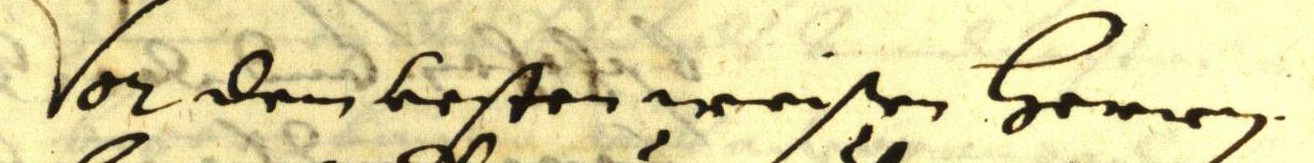Vor dem vesten weisen Herrn
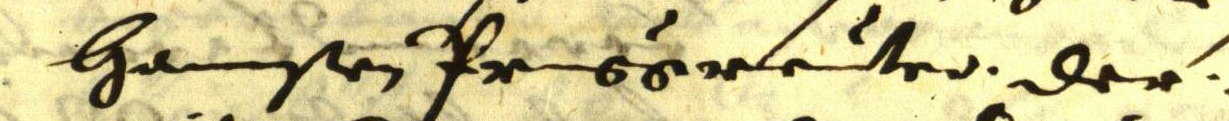Hannsen Prūggreūter der¬
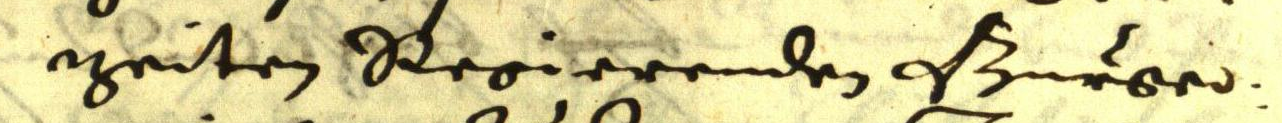zeiten Regierenden Būrger¬
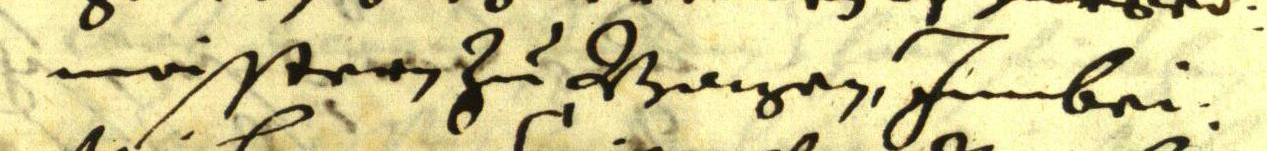maisstern Zū Bozen, Innbei¬
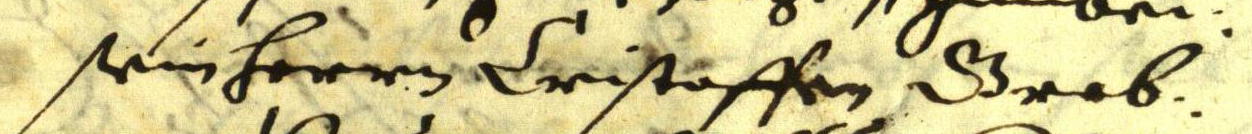sein herrn Cristoffen Greb¬
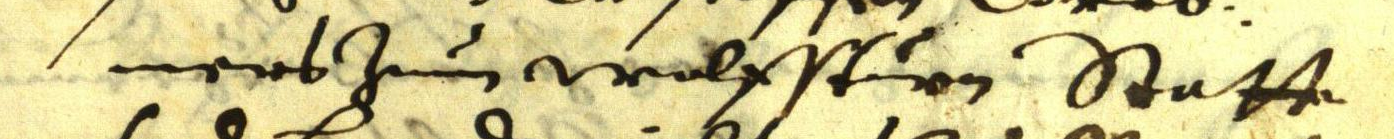ners Zūm Wolfstūrn Statt¬
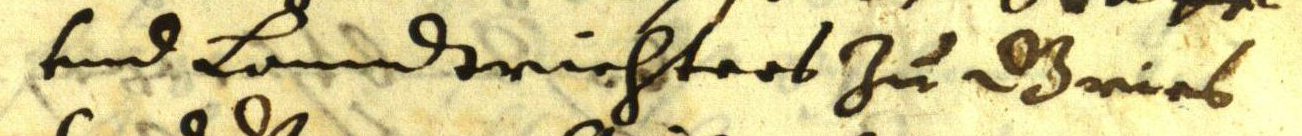vnd Lanndtrichters Zū Gries
